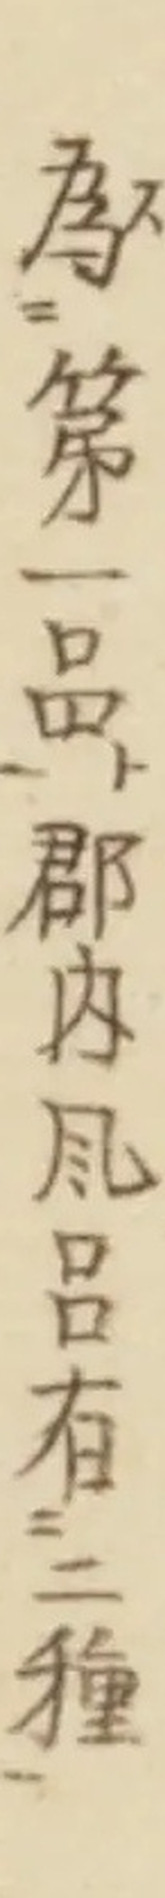爲す第一品と郡内風呂有二種
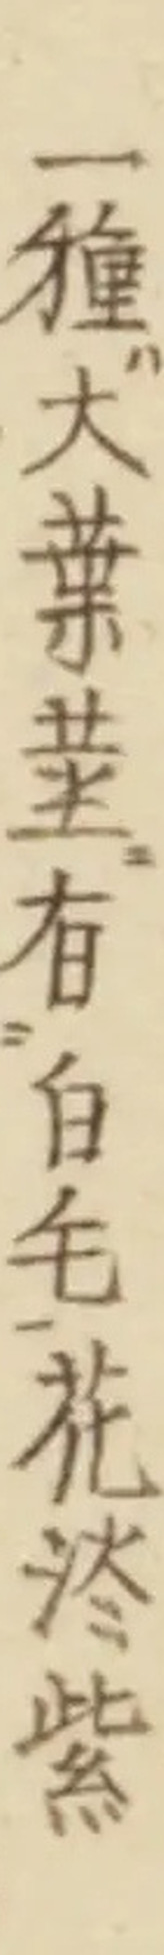一種は大葉茎に有白毛花淡紫

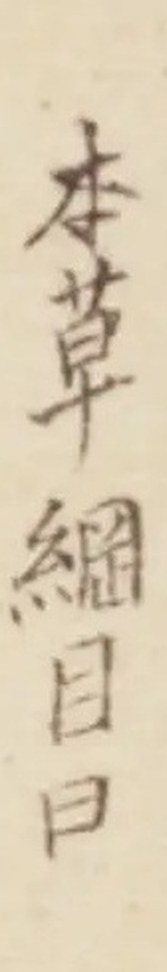本草綱目曰
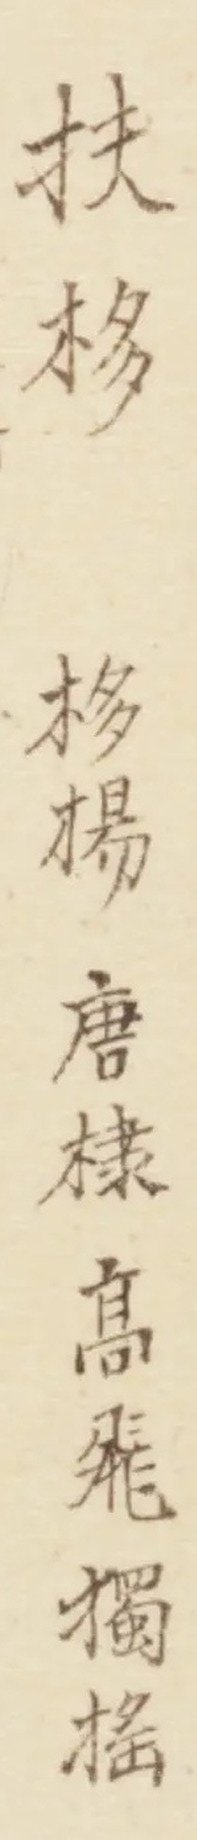扶移移楊唐棣髙飛獨搖
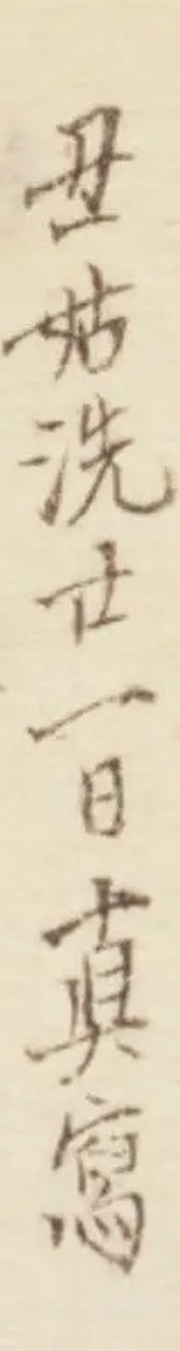丑姑洗廿一日真寫

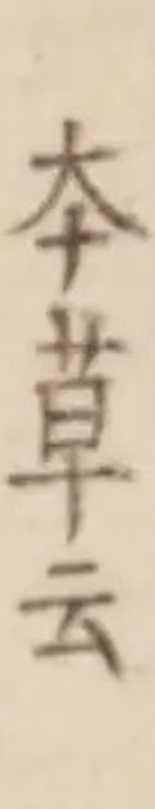本草云
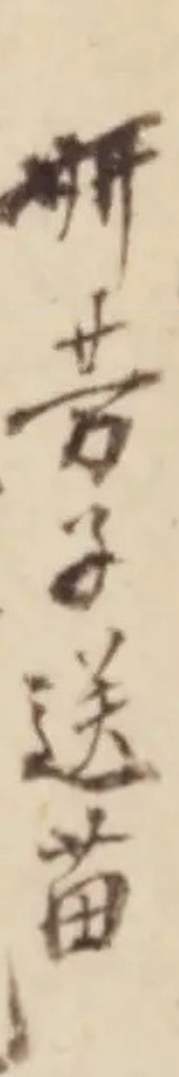妍芳子送苗
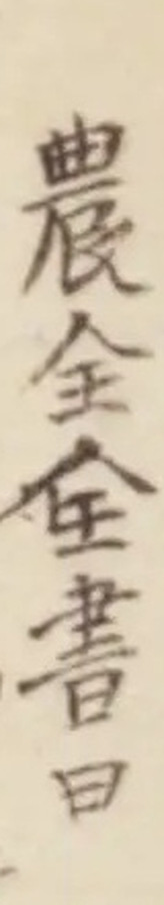農全全書曰
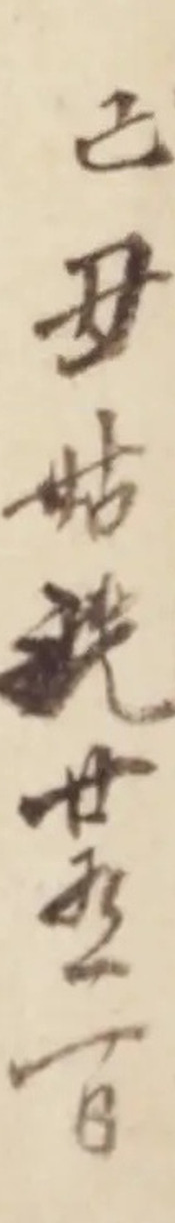丑姑洗廿有一日
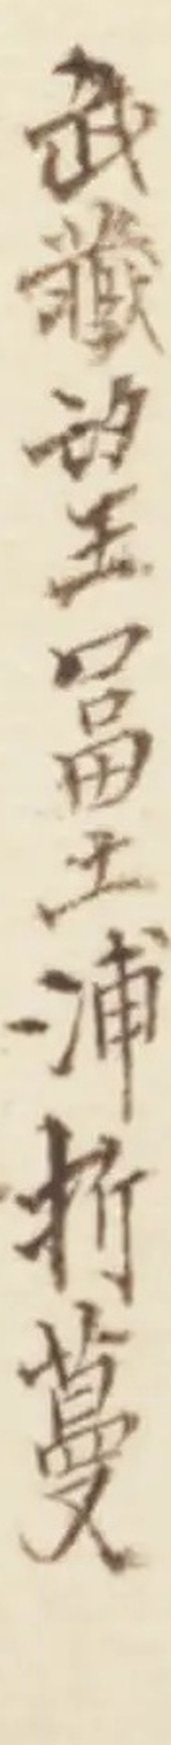武藏望冨土浦折蔓
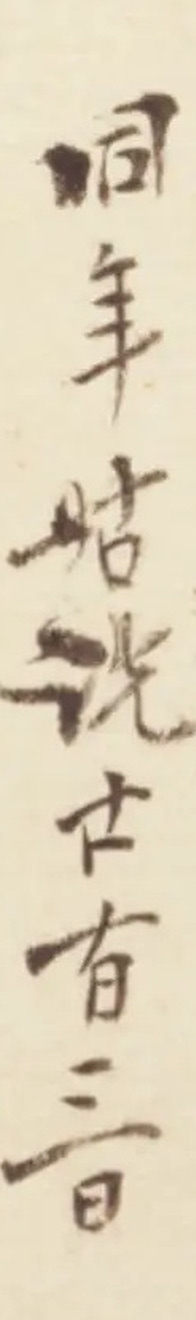同年姑洗廿有三日

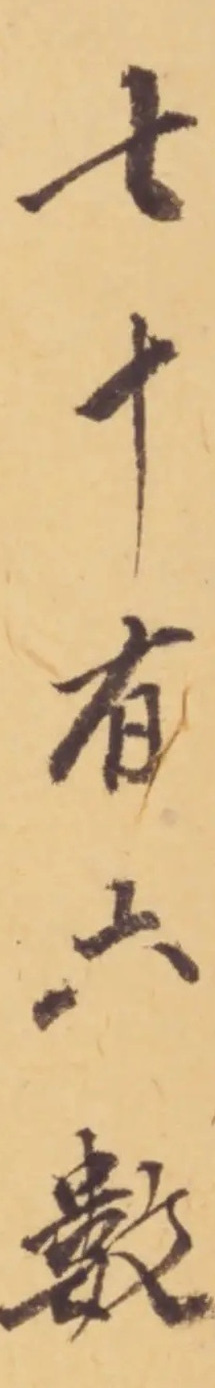七十有六数
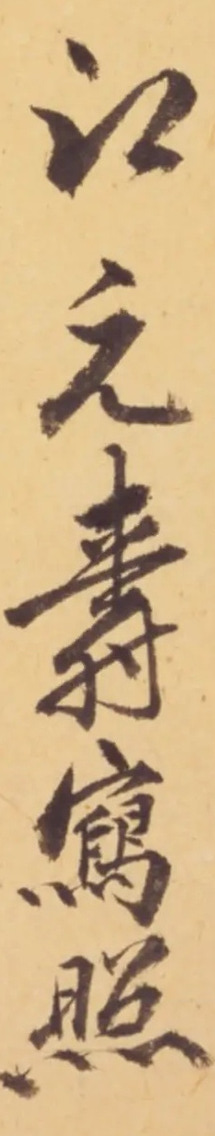江元壽寫照
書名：梅園草木花譜春之部. 3
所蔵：国立国会図書館 National Diet Library, JAPAN
